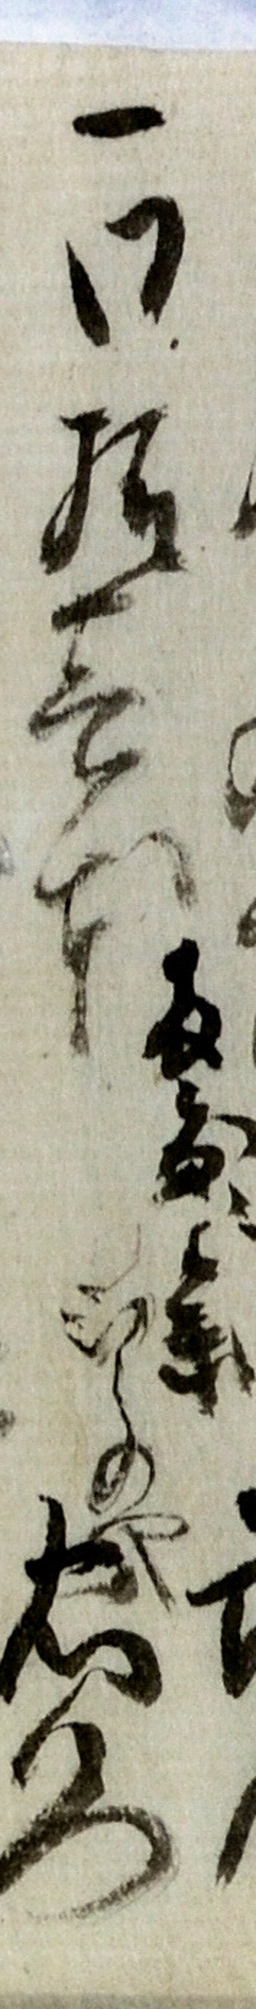一同拾壱本忠左衛門
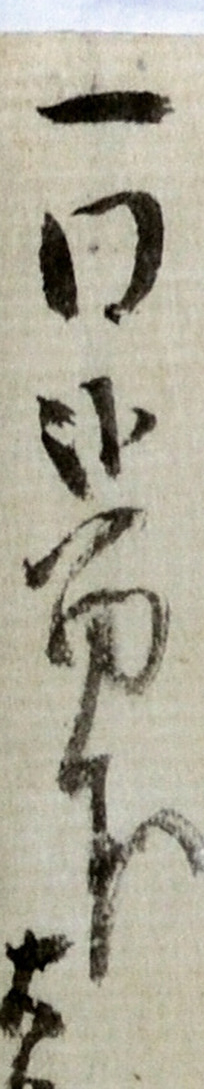一同弐百本彦右衛門

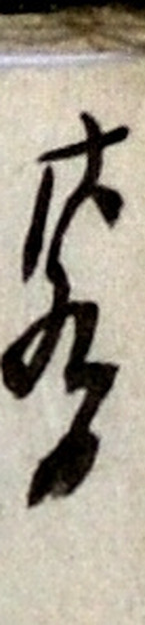廿九日
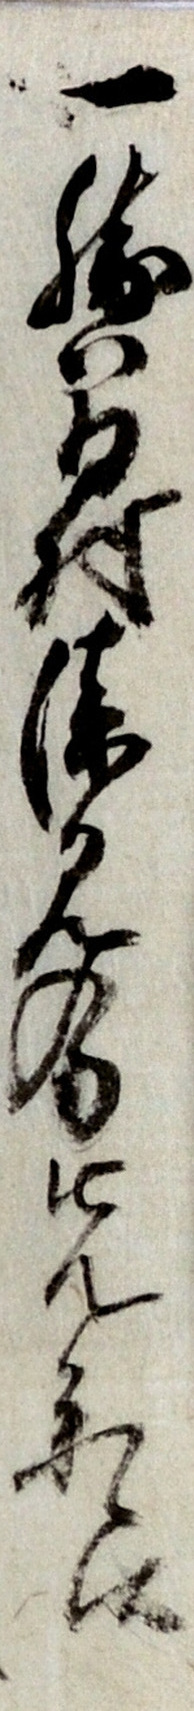一勝間村漆見分先参候所
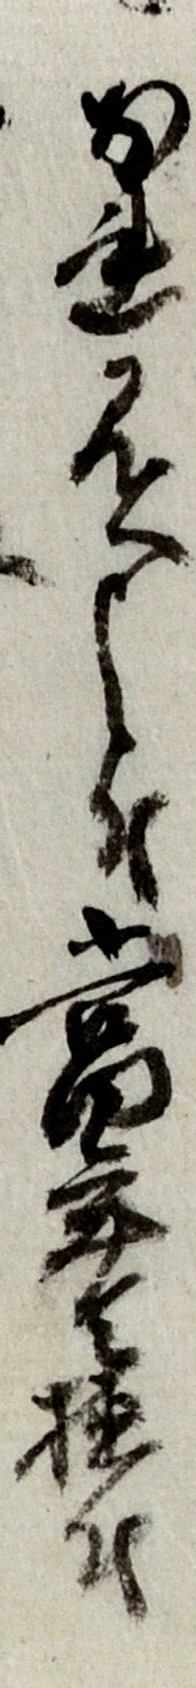かれ見へ申候付当年は植付
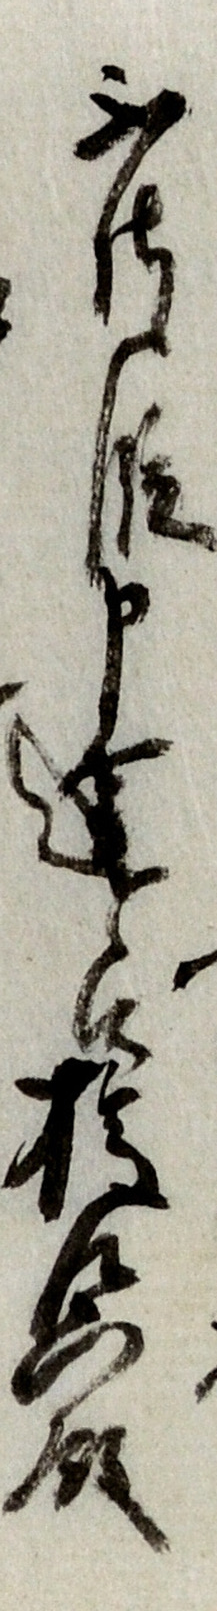不仕候段申達候様権左衛門殿
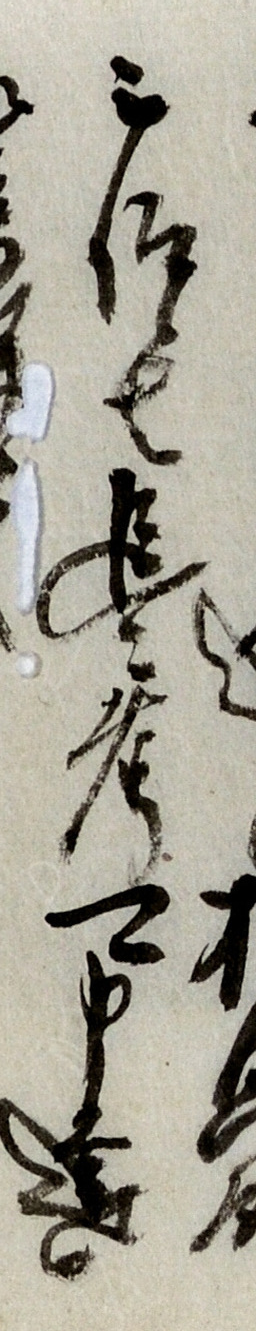被仰候は追々考可申達而
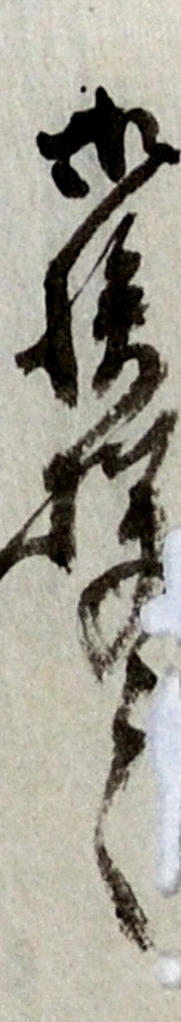御挨拶ニ候
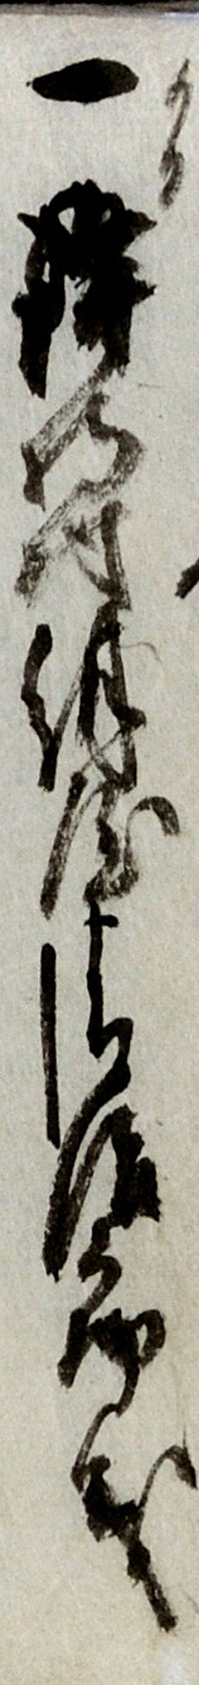一鉾持村紺屋清治郎義
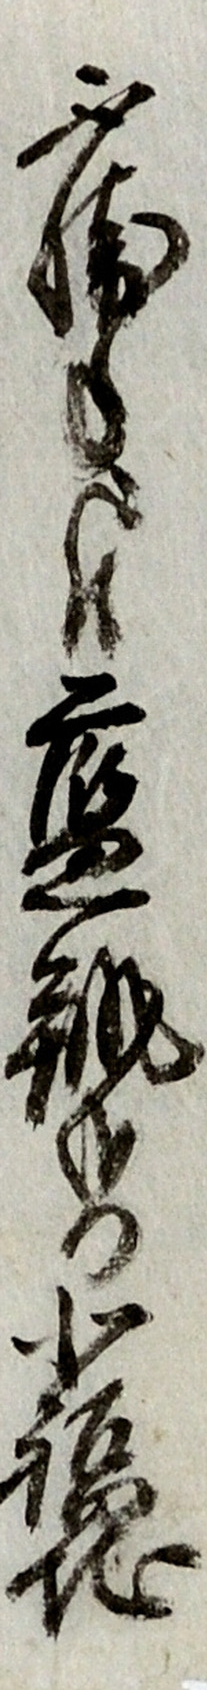不勝手ニ付藍瓶弐つ北福地
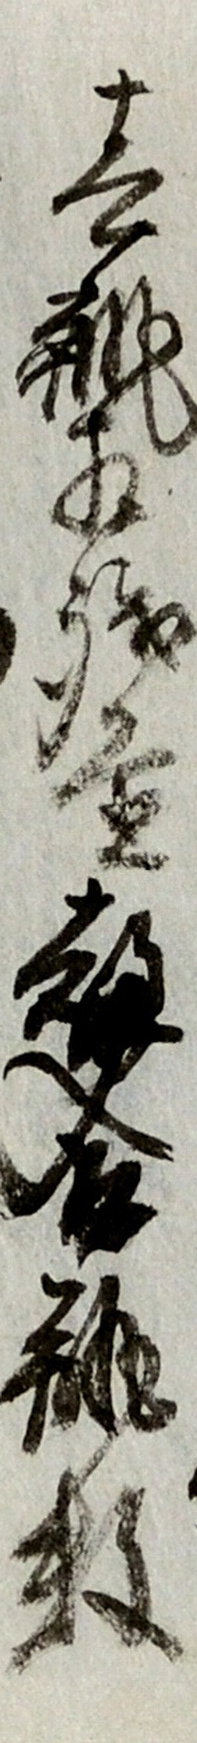壱瓶相残置都合瓶数
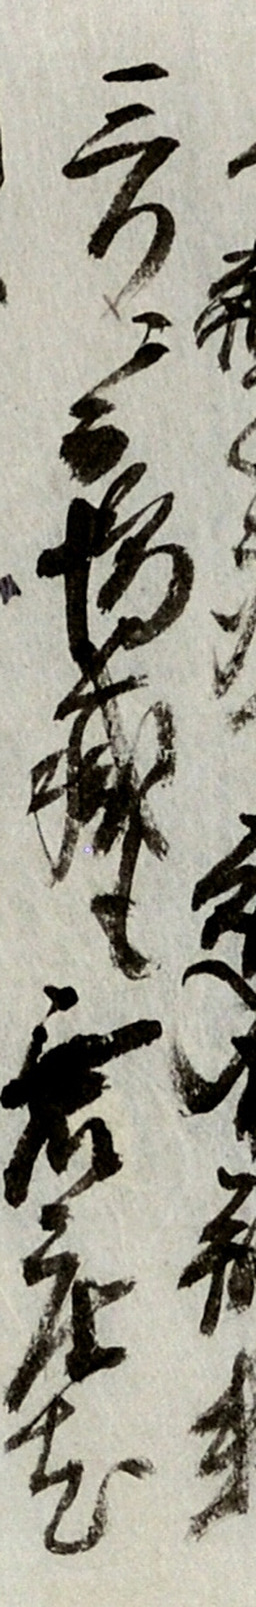三つニ而増減も無御座尤
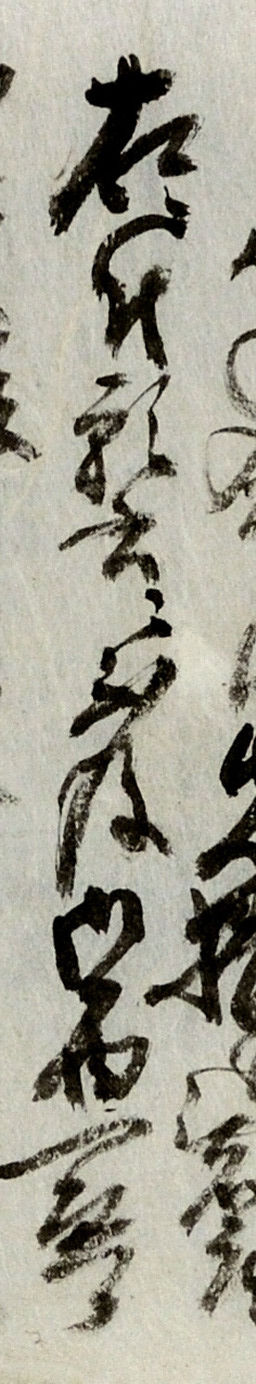右ニ付願書ニ不及御届一通り
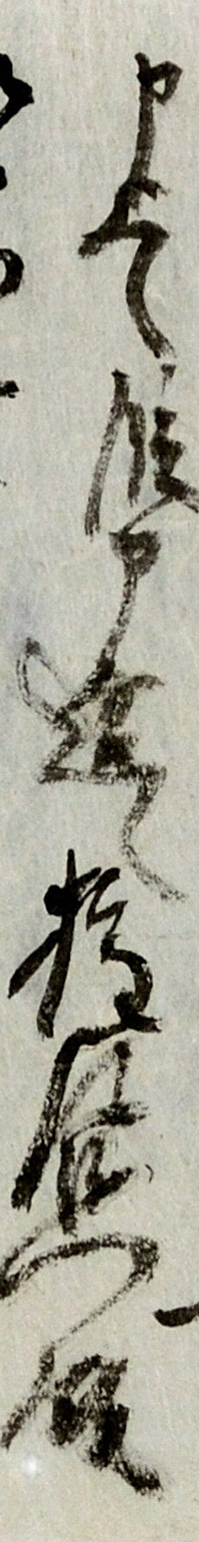申上候段申達候権左衛門殿
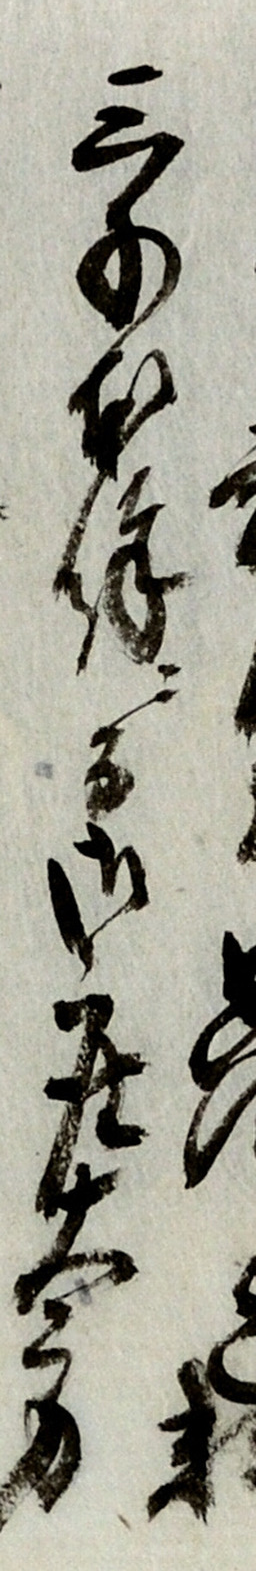三千本余ニ而御座候右方
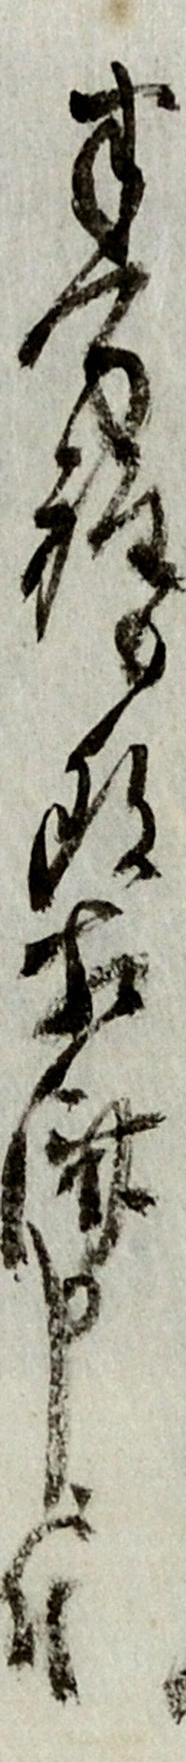半分程も改相済申ニ付
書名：分一方諸事御用留帳
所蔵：伊那市立高遠町図書館・合同会社AMANE
